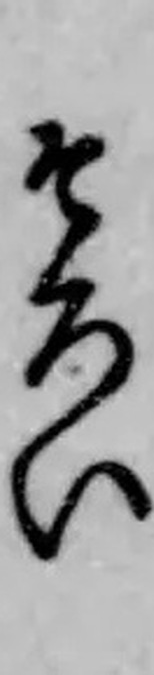そろい
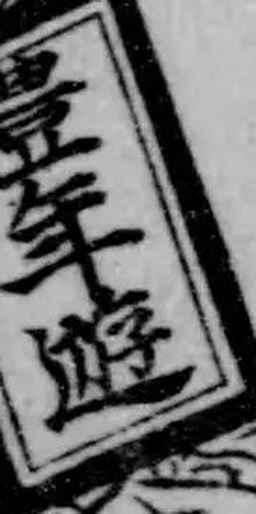豊年遊
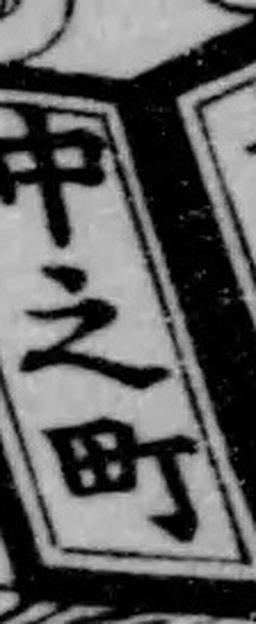中之町
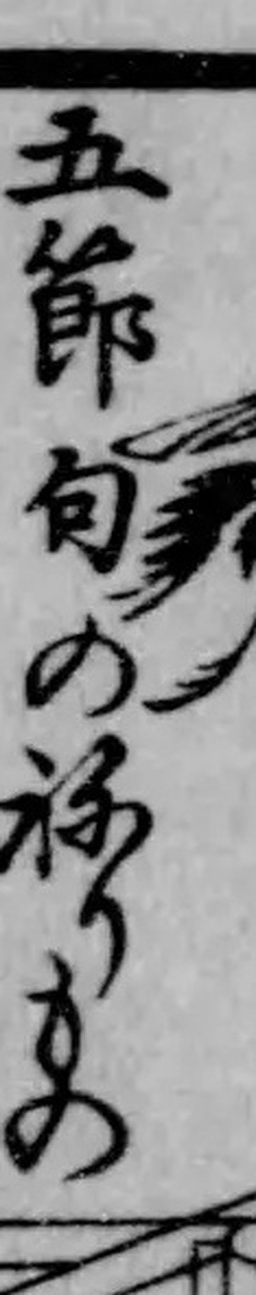五節句のねりもの
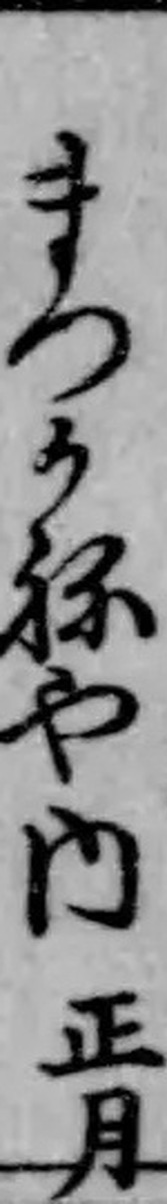まつかねや内正月
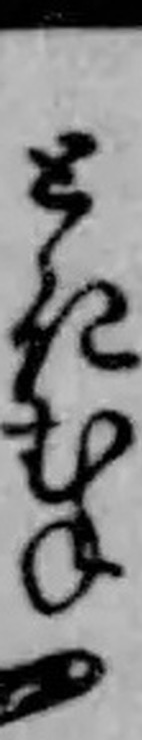ときむね
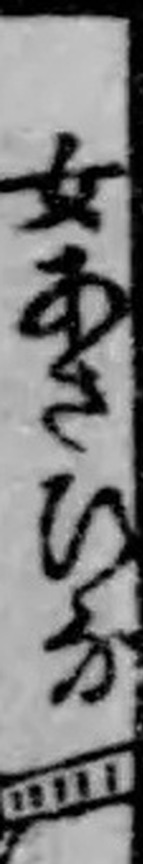女あさひな

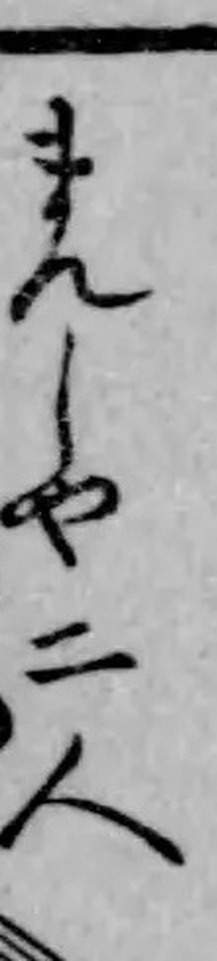まんしや内二人
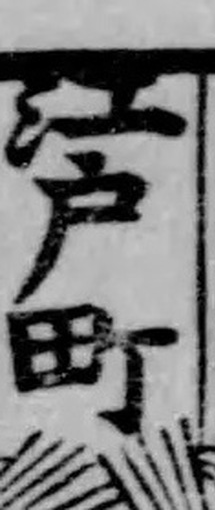江戸町
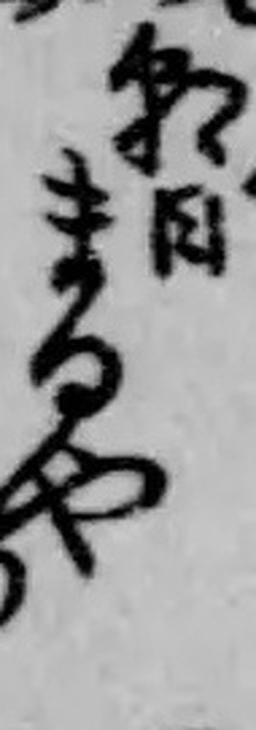まるや
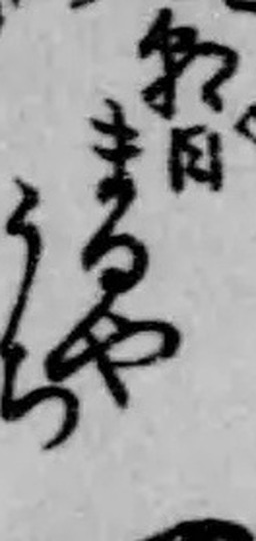まるや

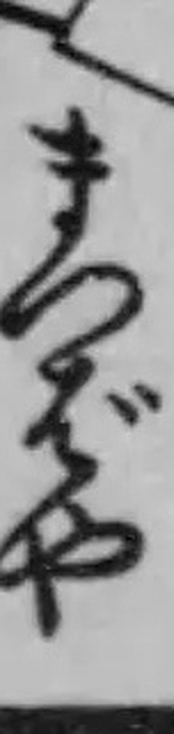まつばや
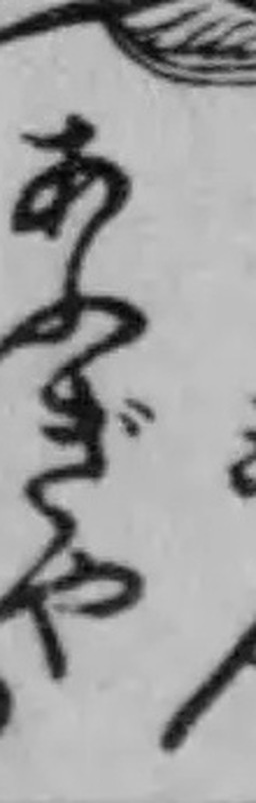あふぎや
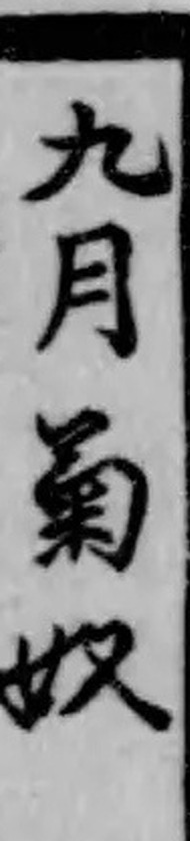九月菊奴
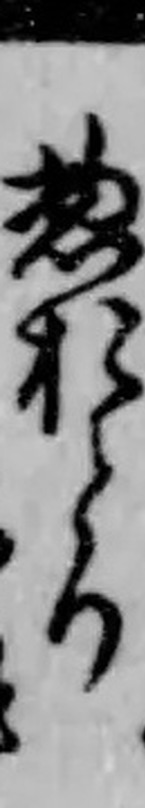惣おとり
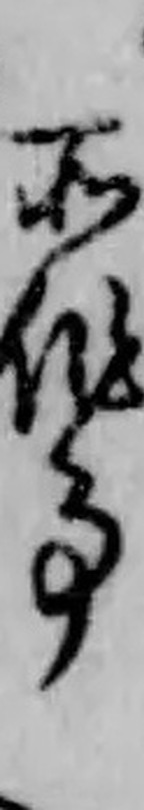所作事
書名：明月余情. 第1編
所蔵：国立国会図書館 National Diet Library, JAPAN
